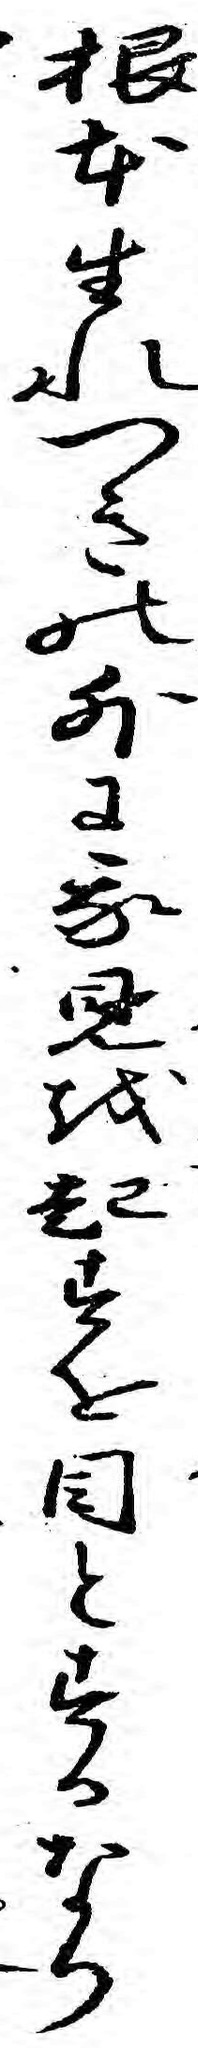根本生れつきの外に家見を起すを目とするなり
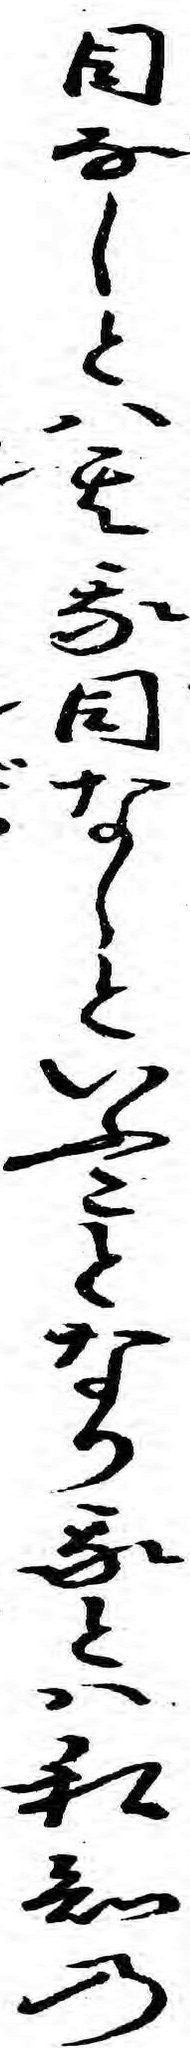目なしとは其我目なしといふことなり我とは私知の
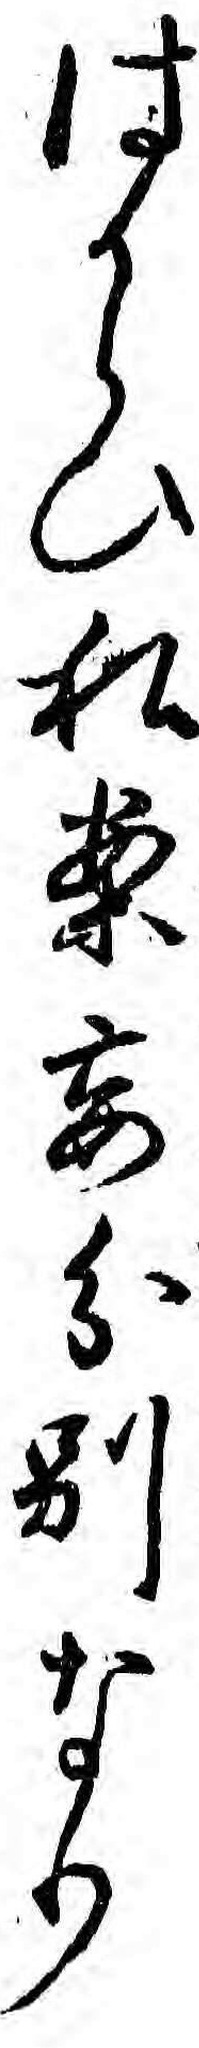はからひ私案妄分別なり
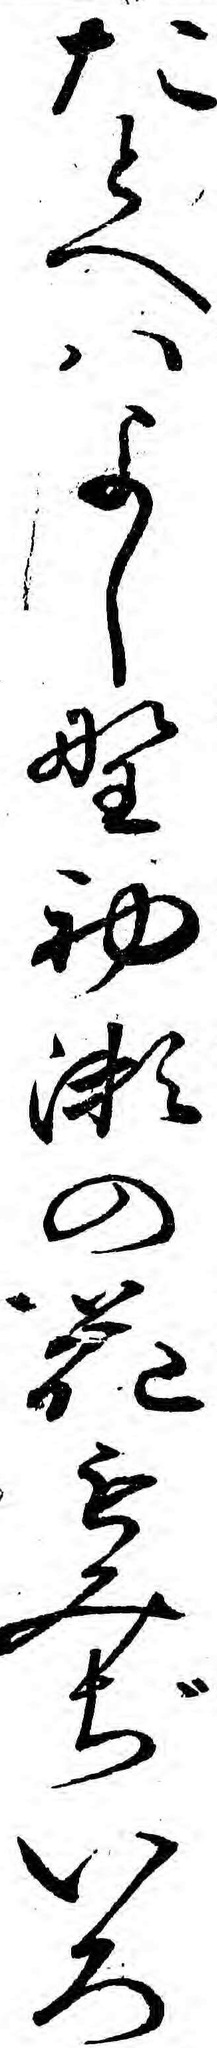たとへはよし野初瀬の花もみぢいろ
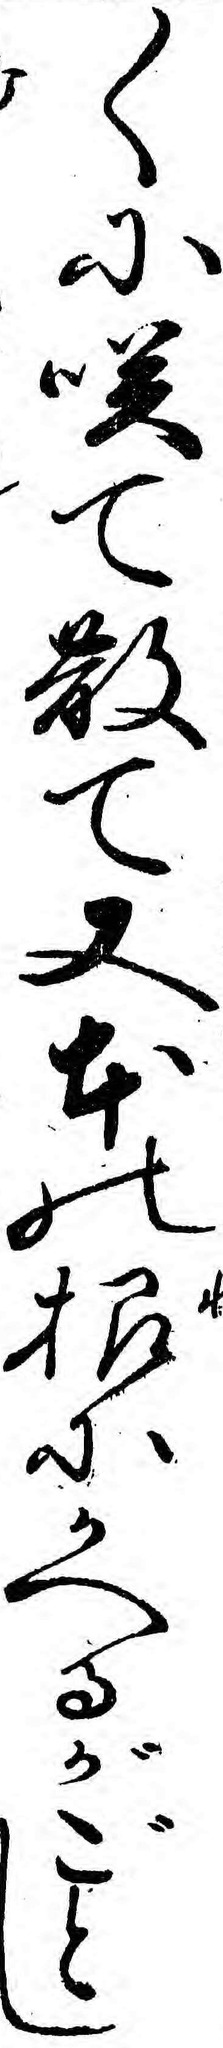〳〵に咲て散て又本の根にかへるがごとし
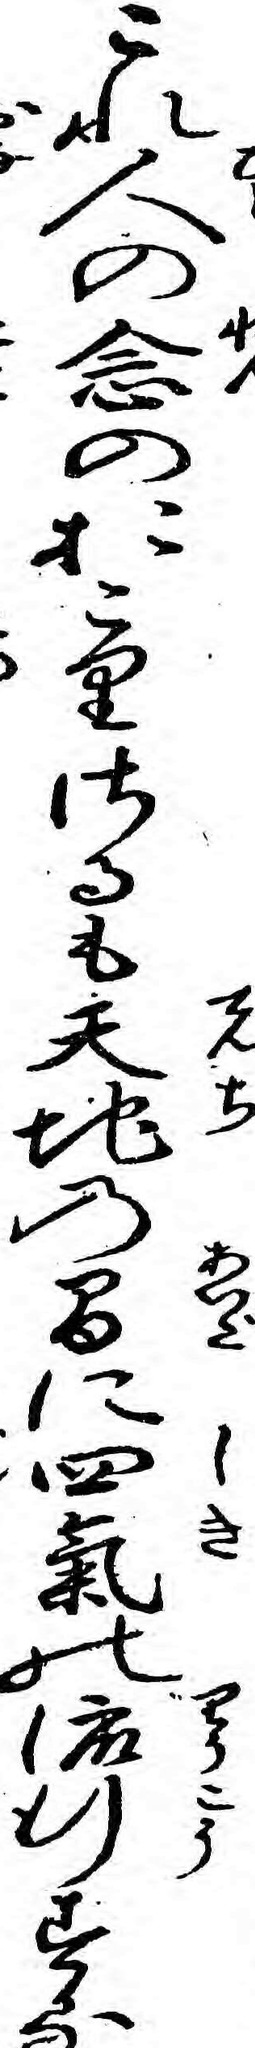これ人の念のおこりさるも天地の間に四気の流行する
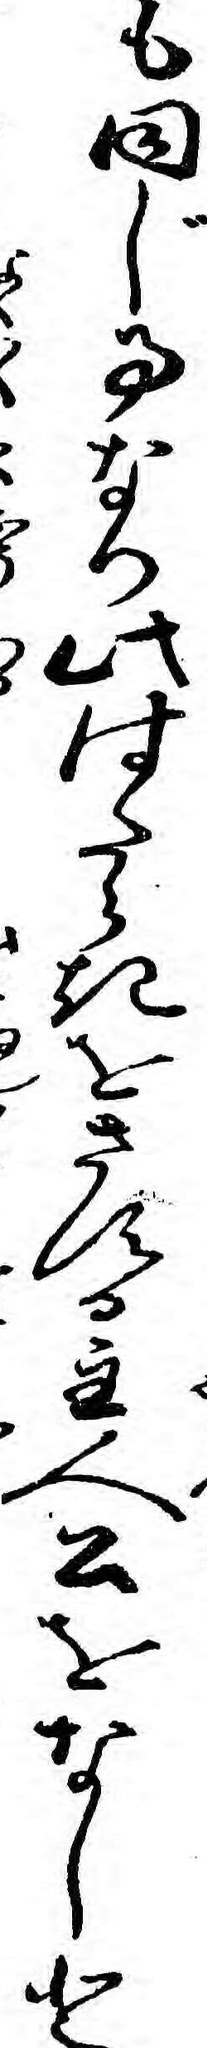も同じ事なり此はたらきをさする主人公をなしと
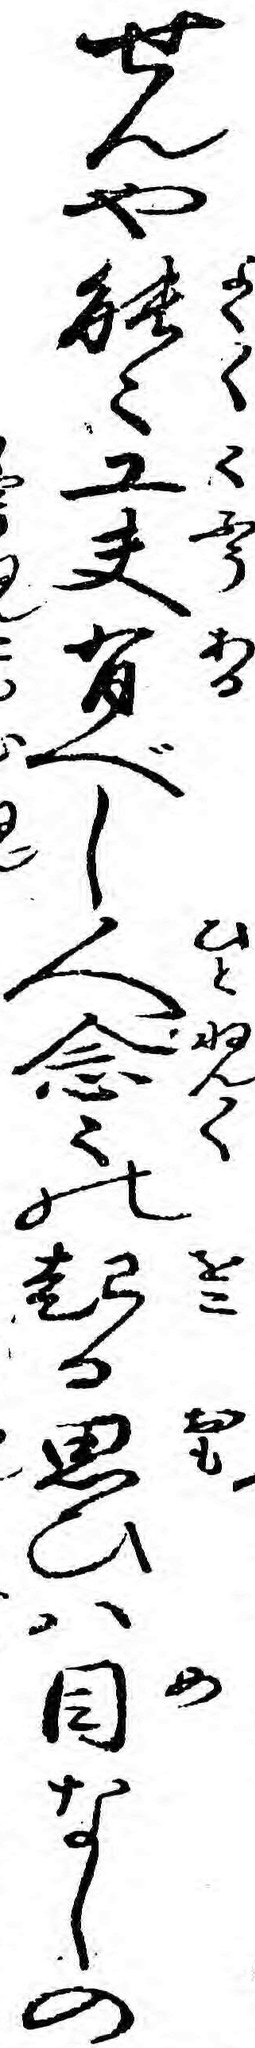せんや能々工夫有べし人念々の起る思ひは目なしの
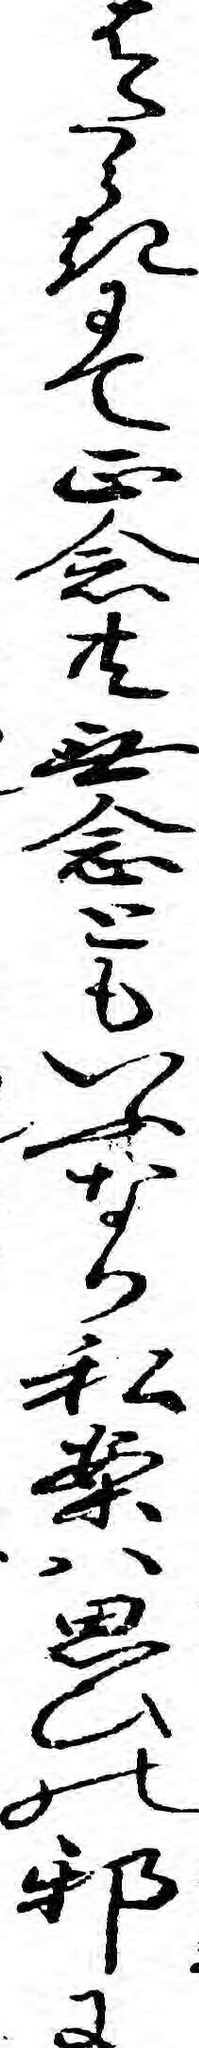はたらきにて正念共無念ともいふなり私案は思ひの邪に
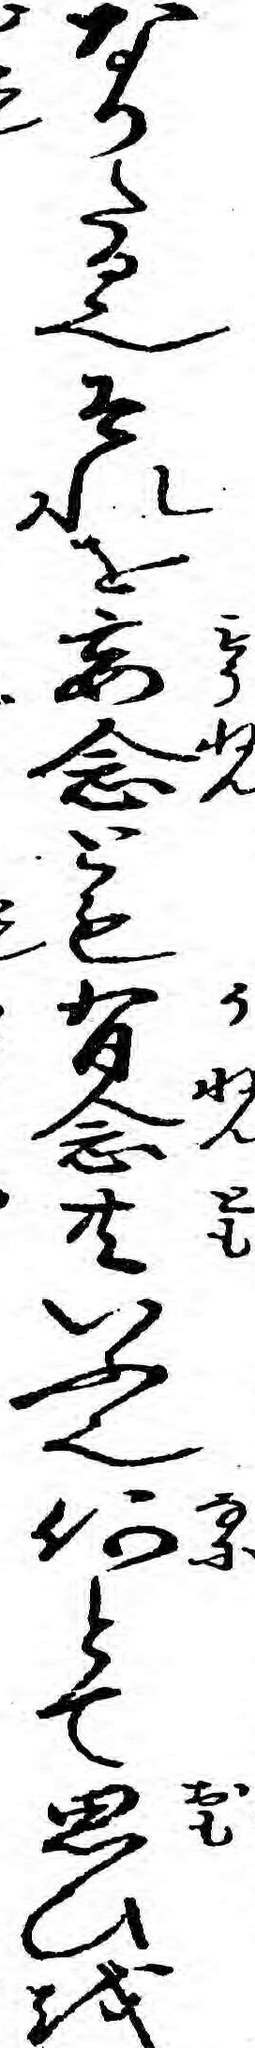なりたる也それを妄念ども有念共いふ也何とて思ひを
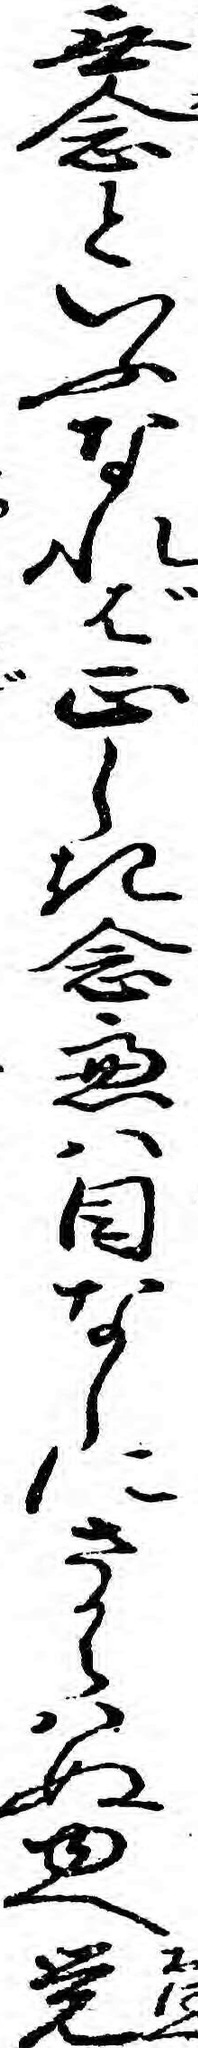無念）といふなれば正しき念慮は目なしにさからはぬゆへ覚
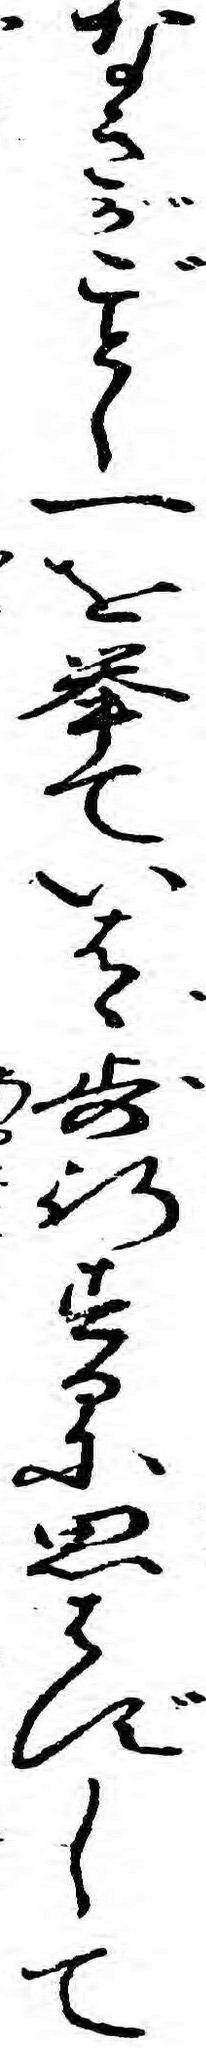なきがごとし一を挙ていはゞ歩行するに思はずして
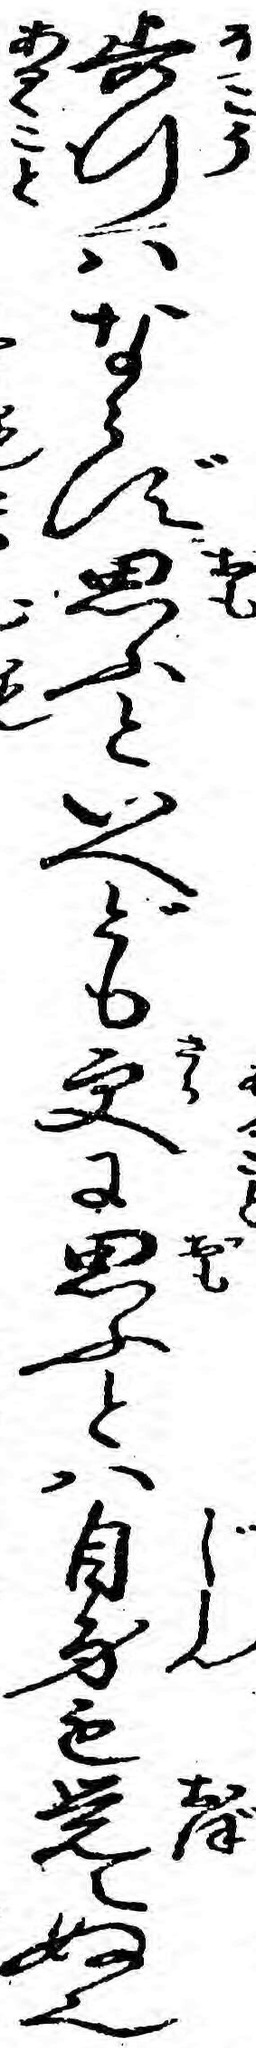歩行はならず思ふといへども更に思ふとは自身も覚えぬ也
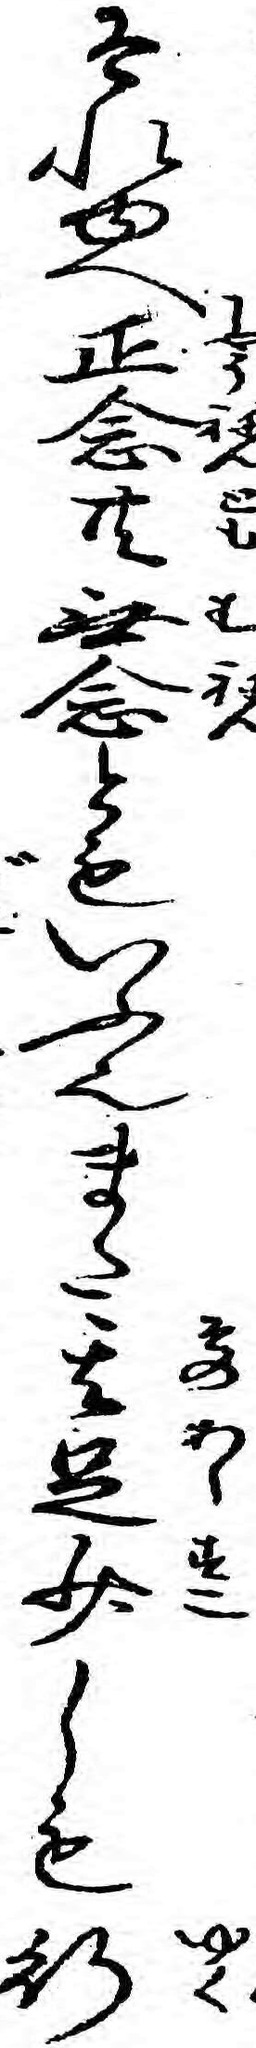それゆへ正念共無念ともいふ也また其足少しも行
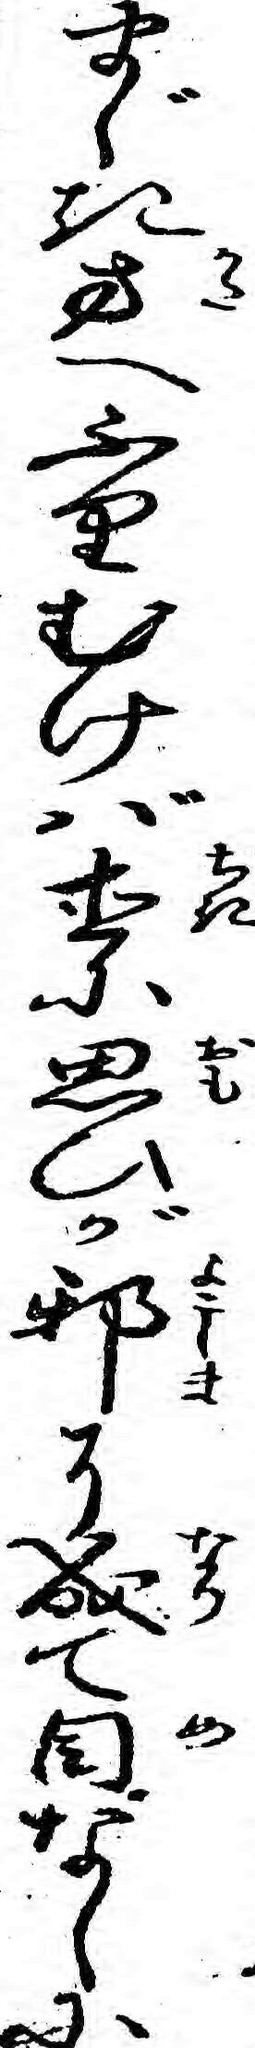まじき方へふりむけば直に思ひが邪に成て目なしに

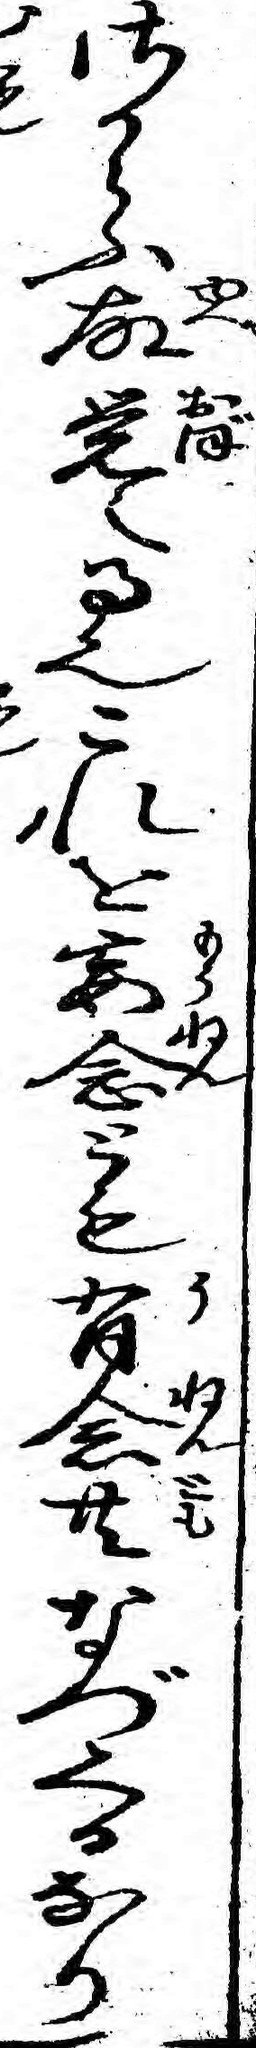さからふ故覚える也これを妄念とも有念共なづくるなり
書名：目なし用心抄
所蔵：国文学研究資料館
